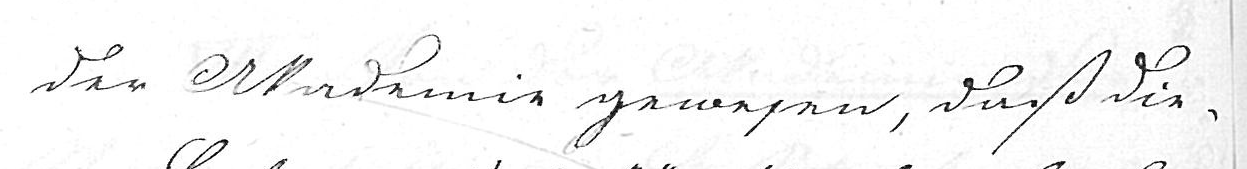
der Akademie gewesen, daß die-
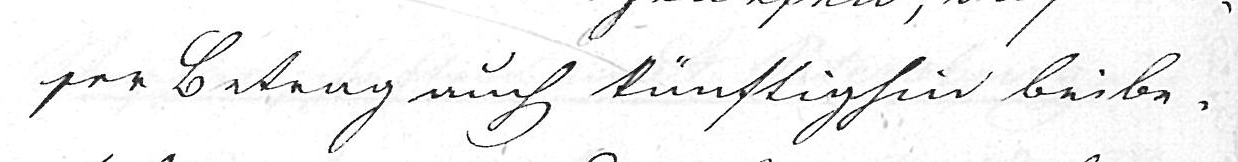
ser Betrag auch künftighin beibe-
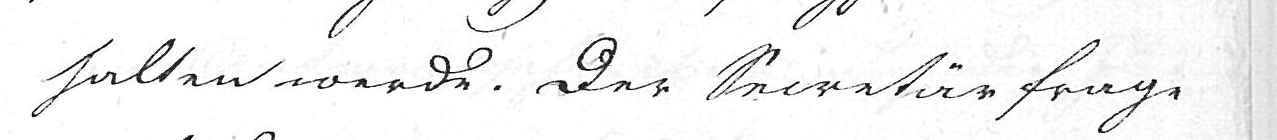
halten werde. Der Secretär frage
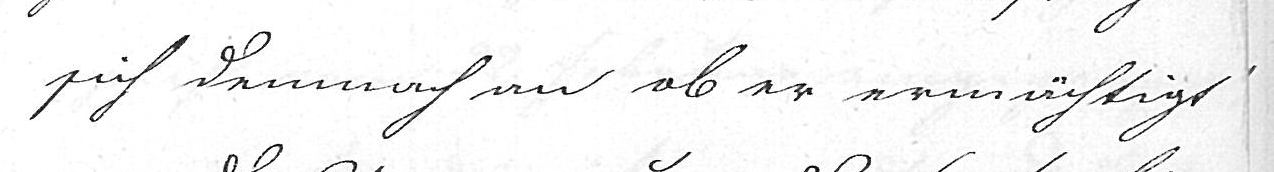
sich demnach an ob er ermächtigt
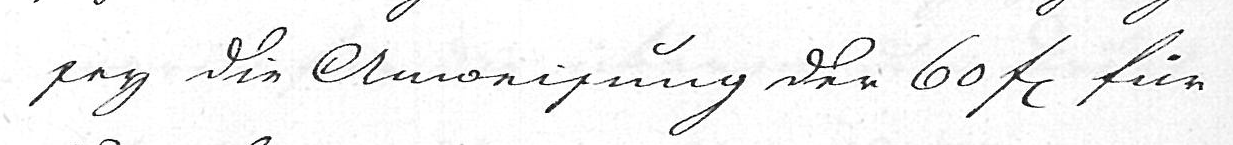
sey die Anweisung der 60 fl. für
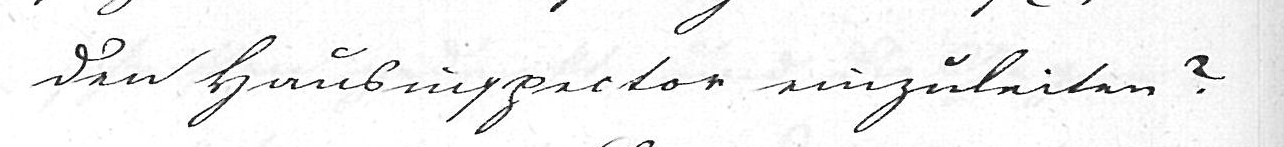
den Hausinspector einzuleiten?
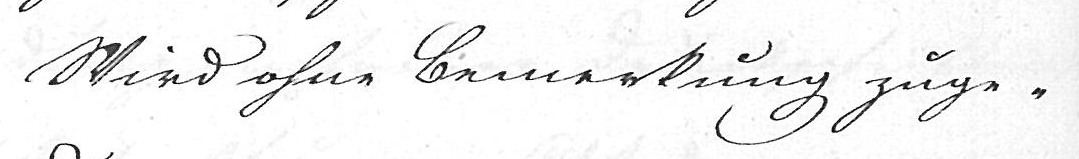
Wird ohne Bemerkung zuge-
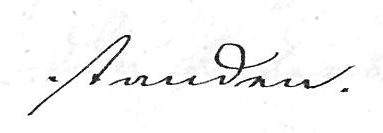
standen.
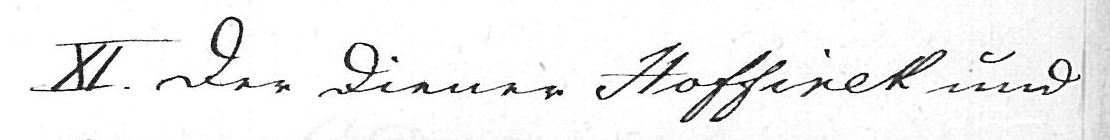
XI Der Diener Hoffirek und
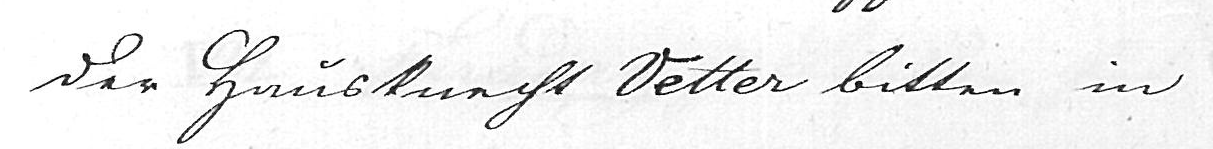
der Hausknecht Vetter bitten in
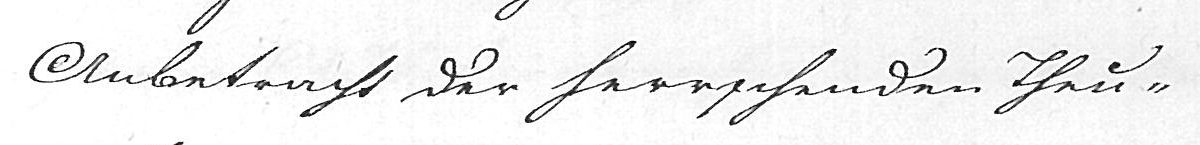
Anbetracht der herrschenden Theu-
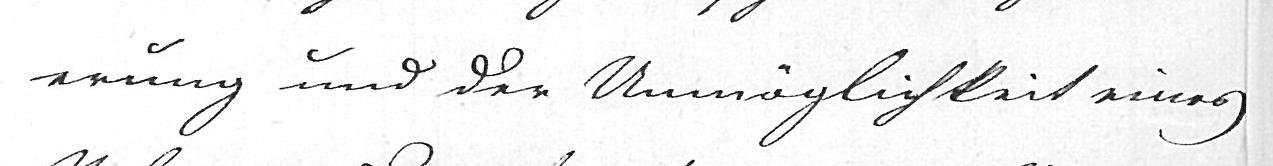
erung und der Unmöglichkeit eines
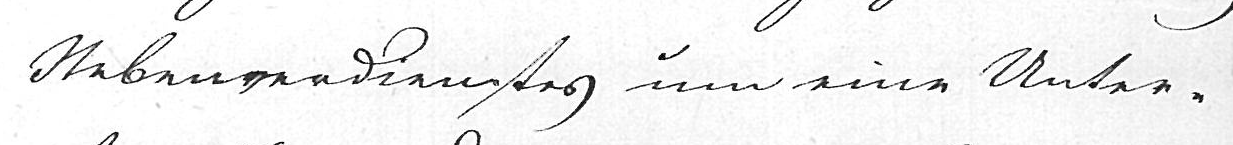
Nebenverdienstes um eine Unter-
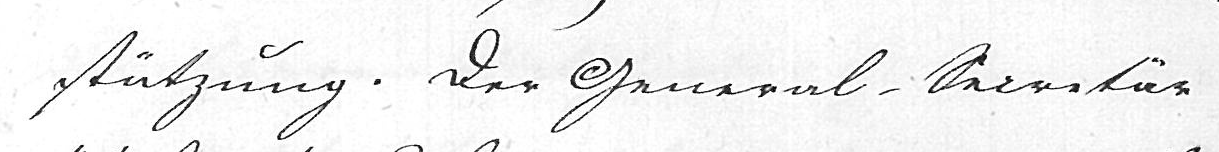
stützung. Der General-Secretär
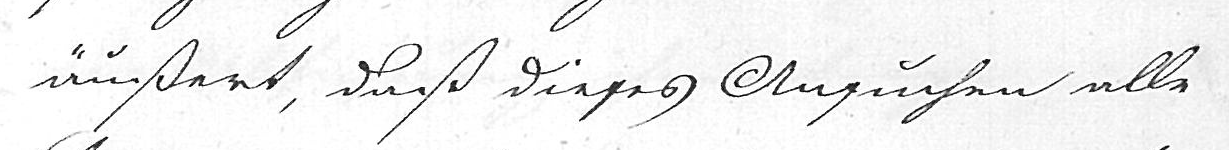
äußert, daß dieses Ansuchen alle
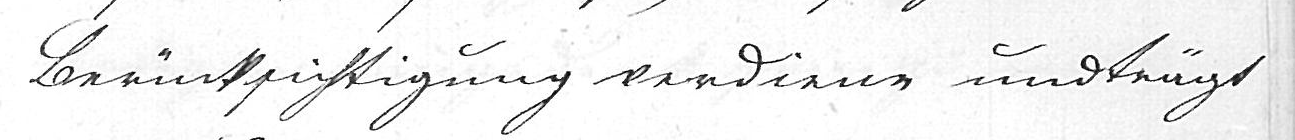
Berücksichtigung verdiene und trägt
